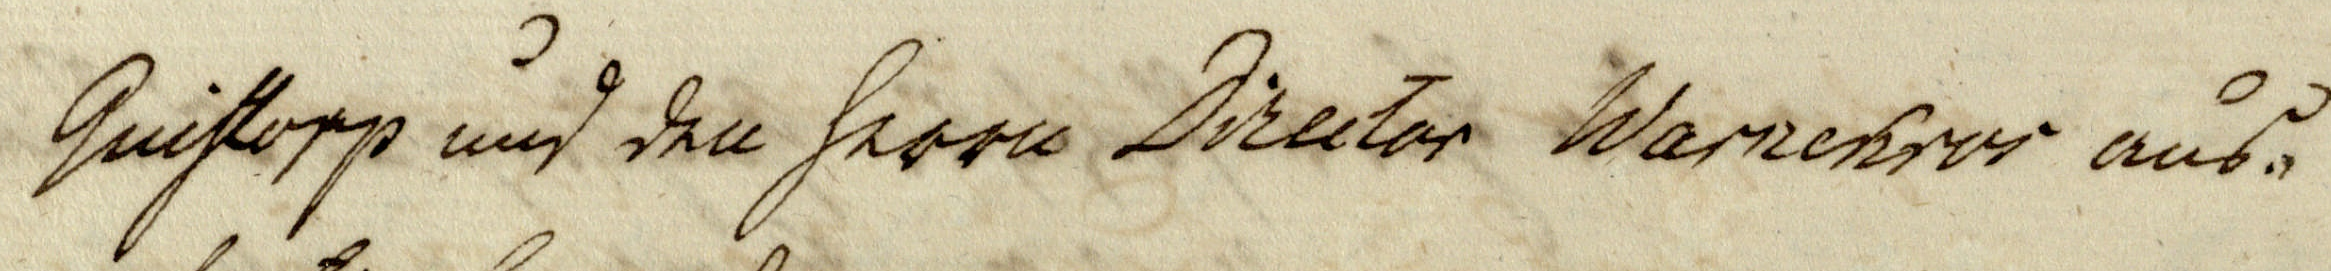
Quistorp und den Herrn Director Warnekros aus¬
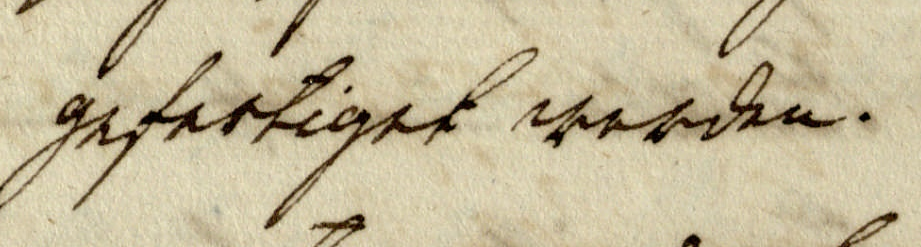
gefertiget werden.
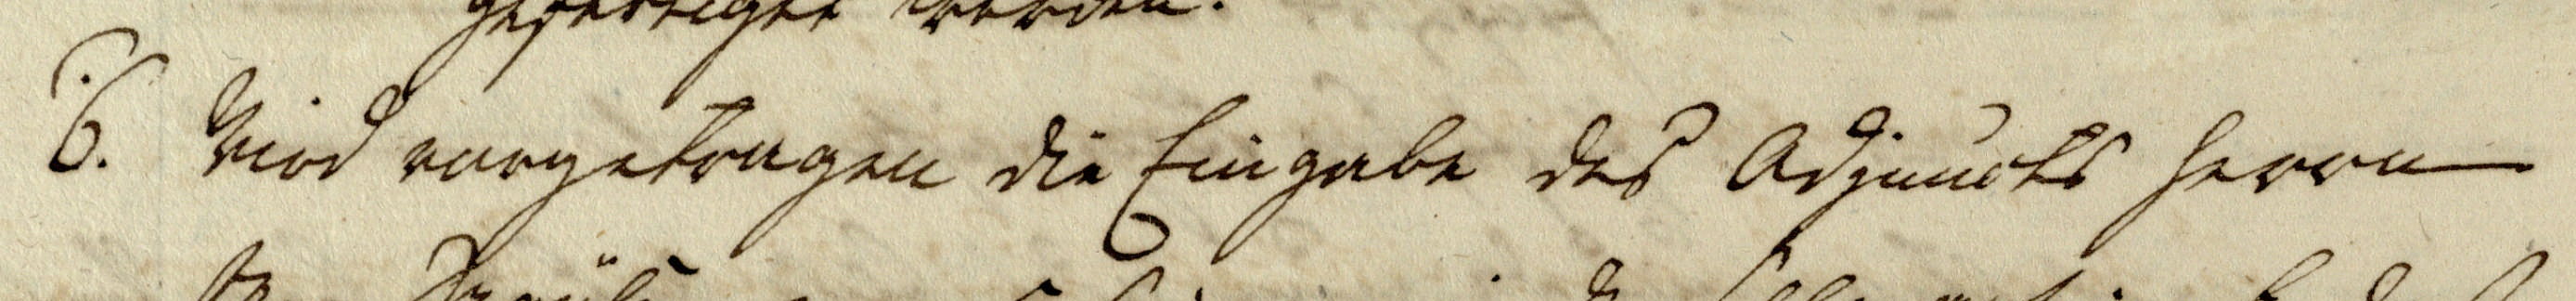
6. Wird vorgetragen die Eingabe des Adjuncts Herrn
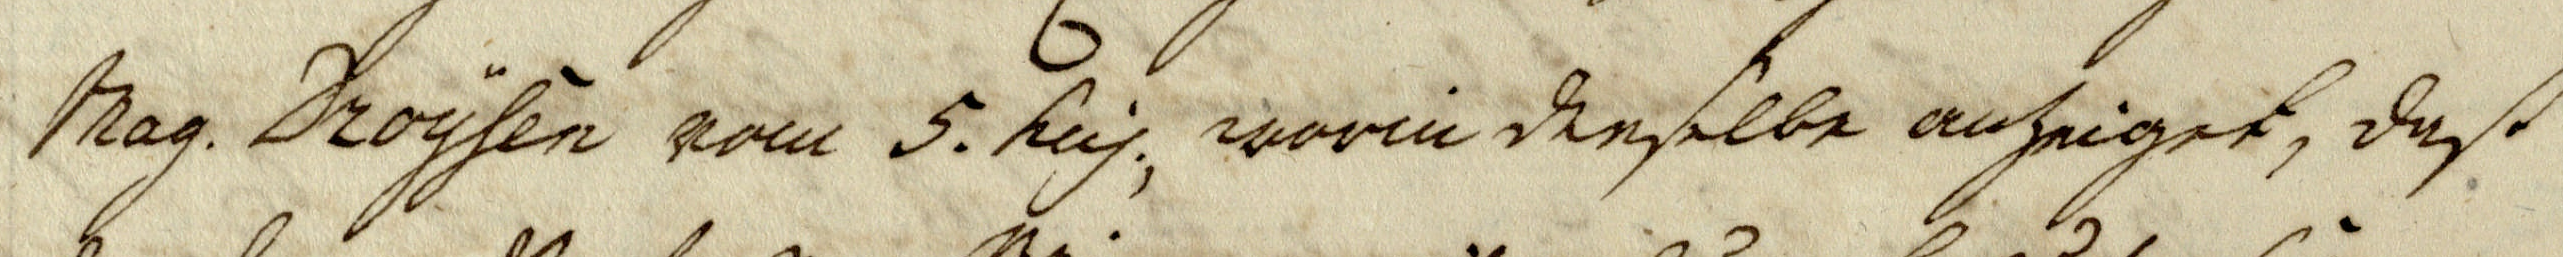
Mag. Droÿsen vom 5. huj., worin derselbe anzeiget, daß
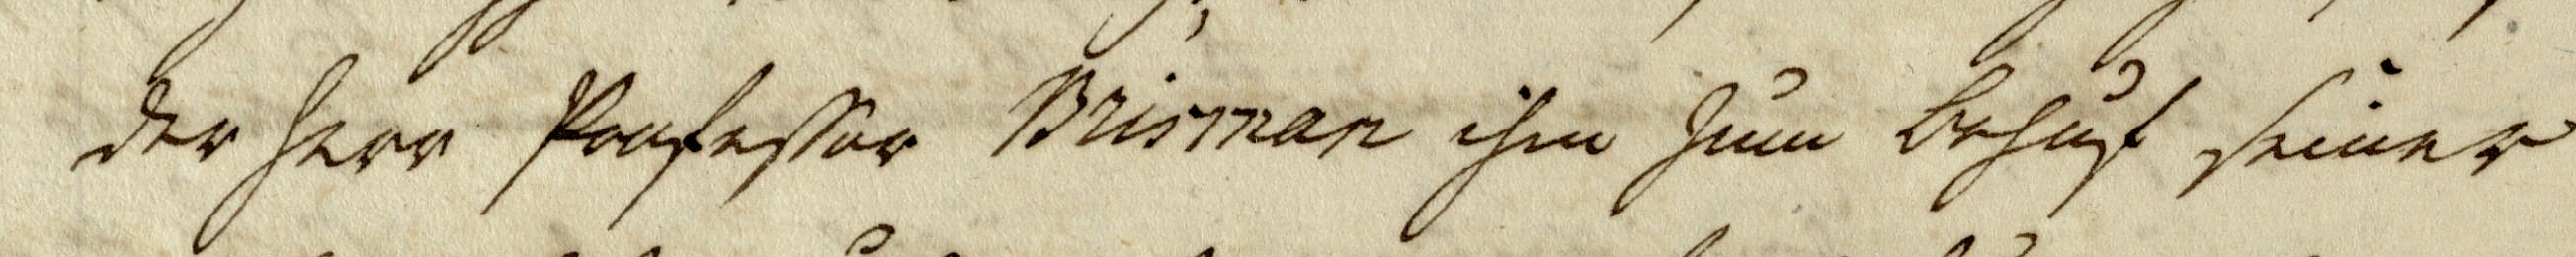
der Herr Professor Brisman ihm zum Behuf seiner
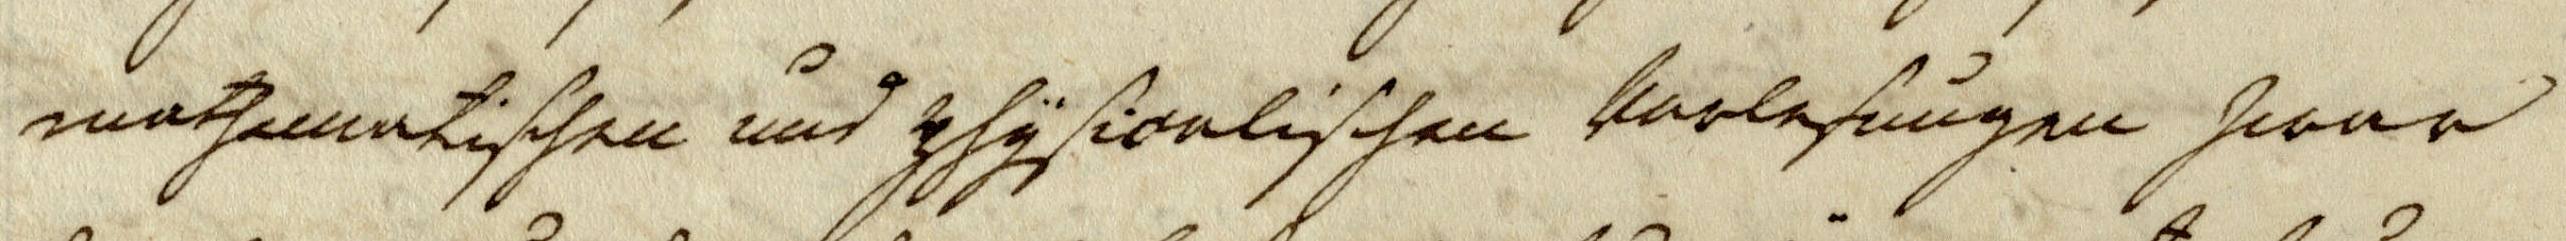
mathematischen und physicalischen Vorlesungen zwar
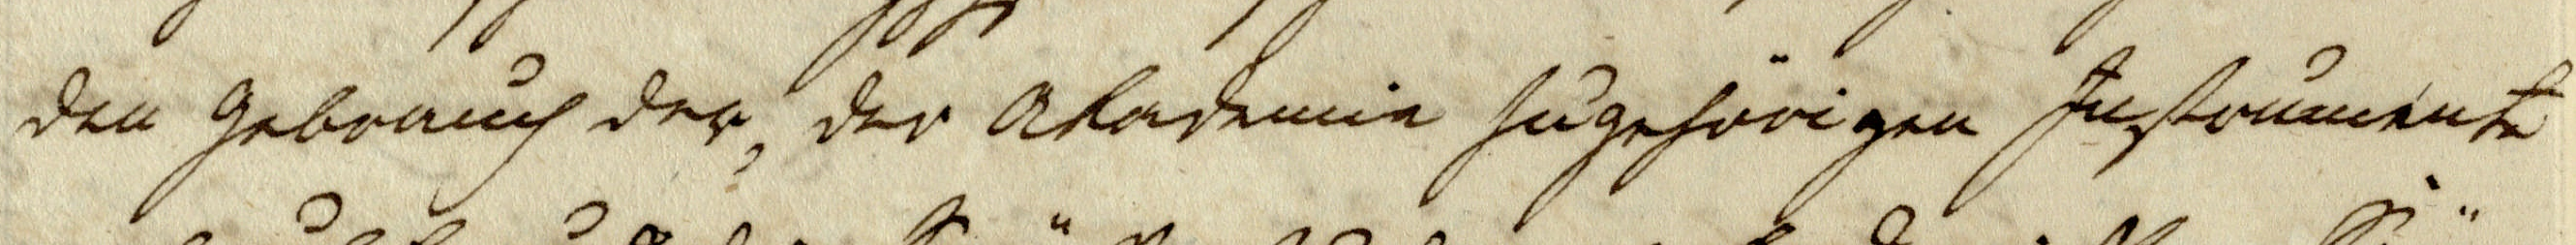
den Gebrauch der, der Akademie zugehörigen Instrumente
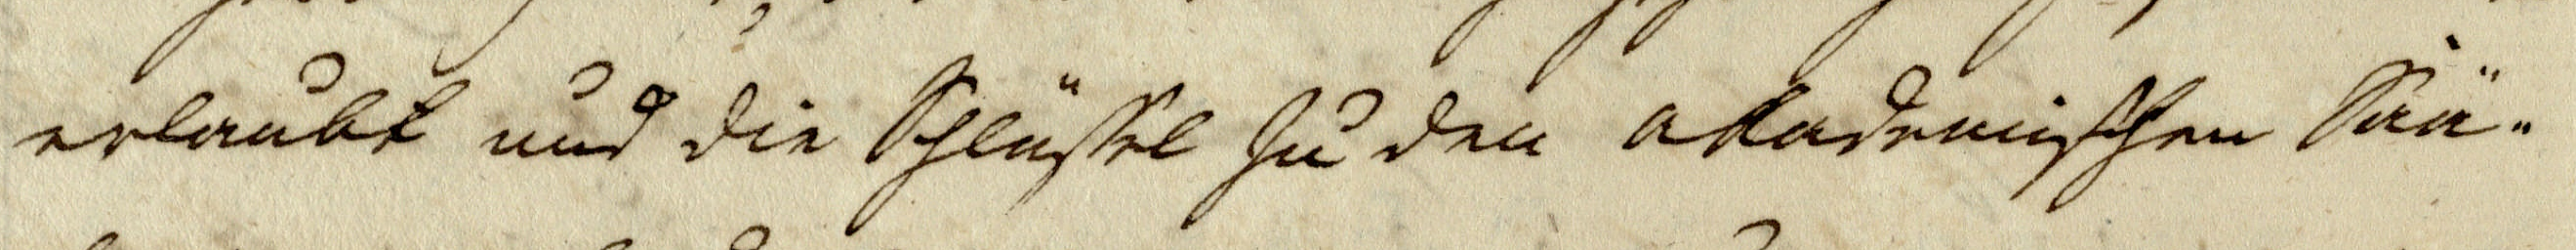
erlaubt und die Schlüssel zu den akademischen Saä¬
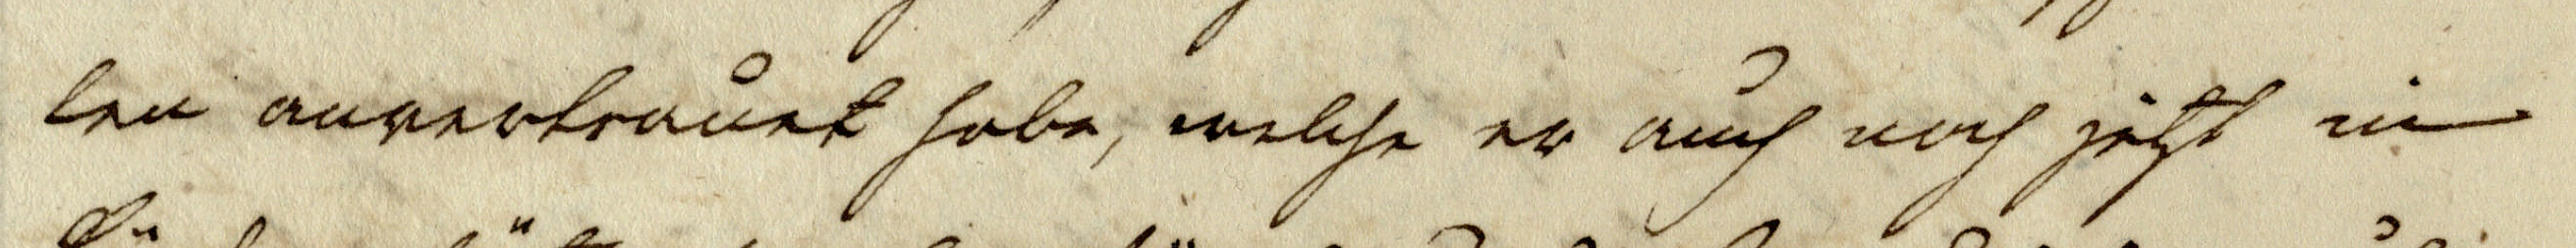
len anvertrauet habe, welche er auch noch jetzt in
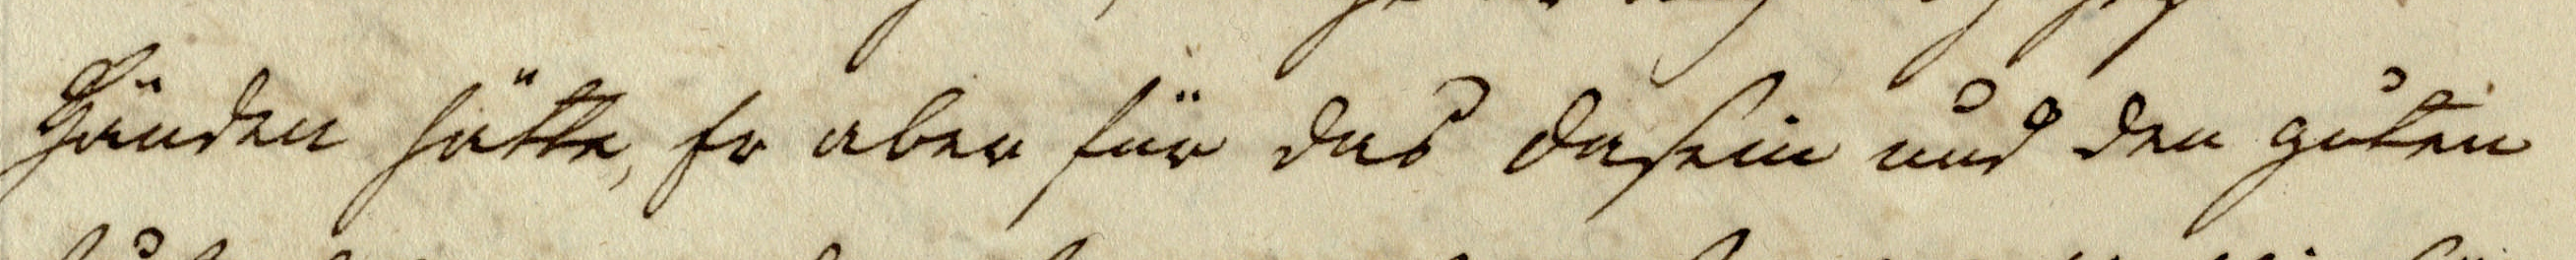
Händen hätte, Er aber für das Dasein und den guten
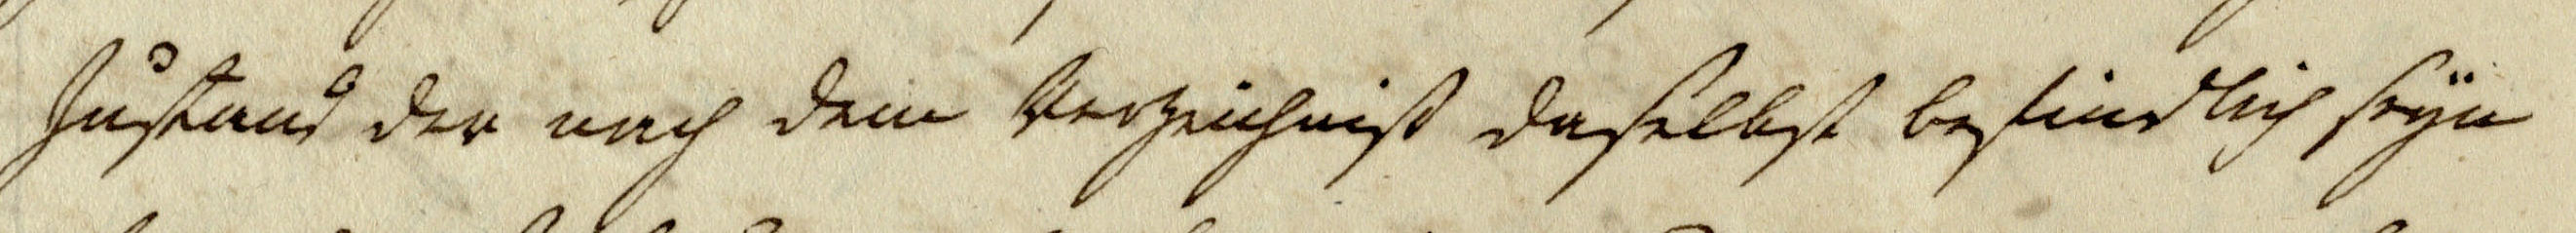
Zustand der nach dem Verzeichniß daselbst befindlich seÿn
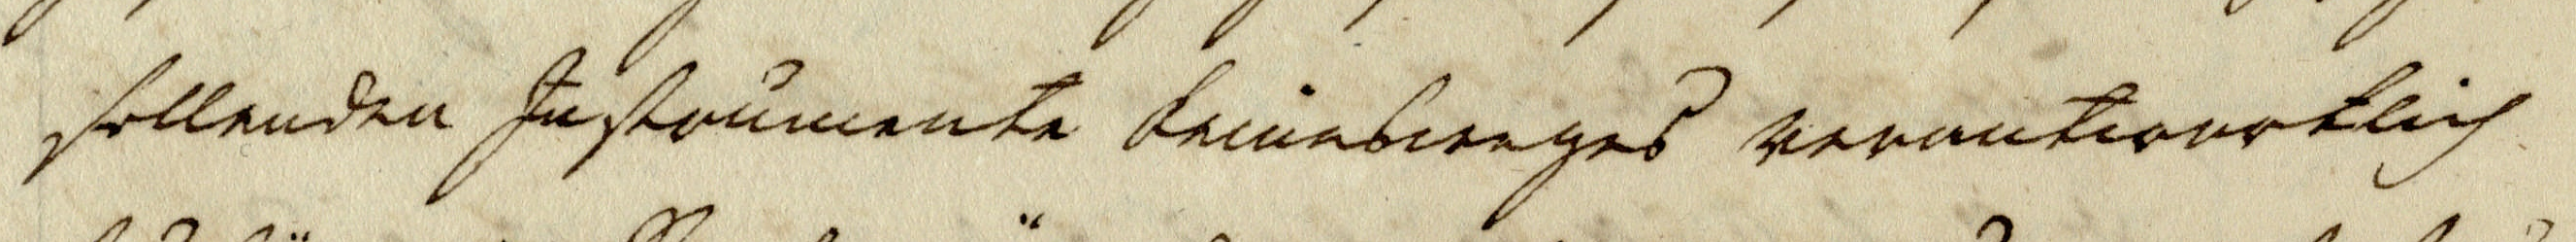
sollenden Instrumente keinesweges verantwortlich
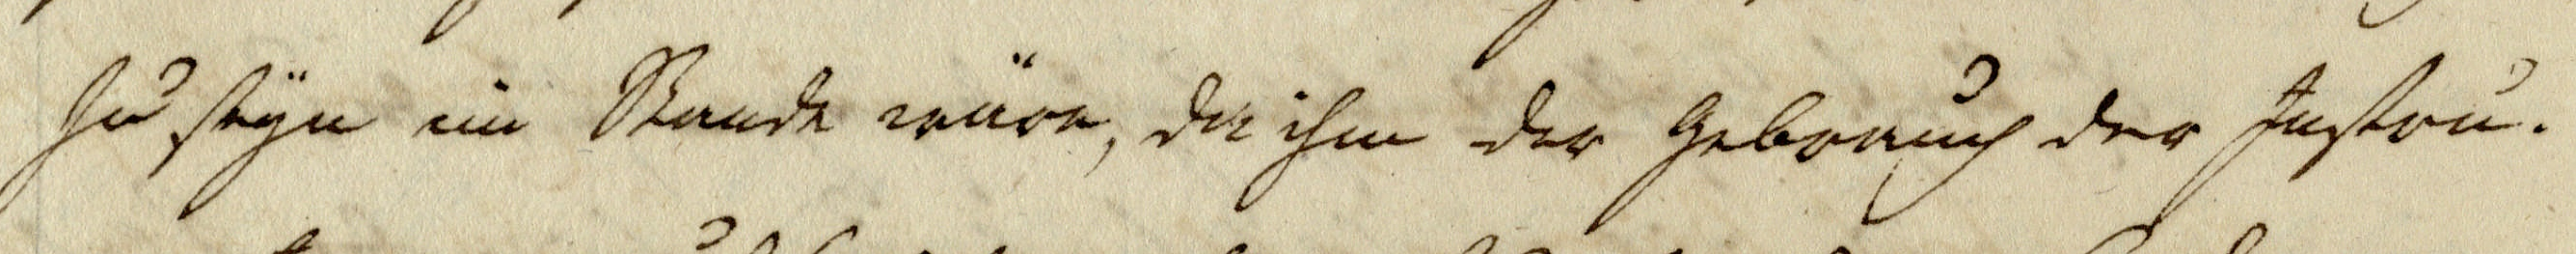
zu seÿn im Stande wäre, da ihm der Gebrauch der Instru¬
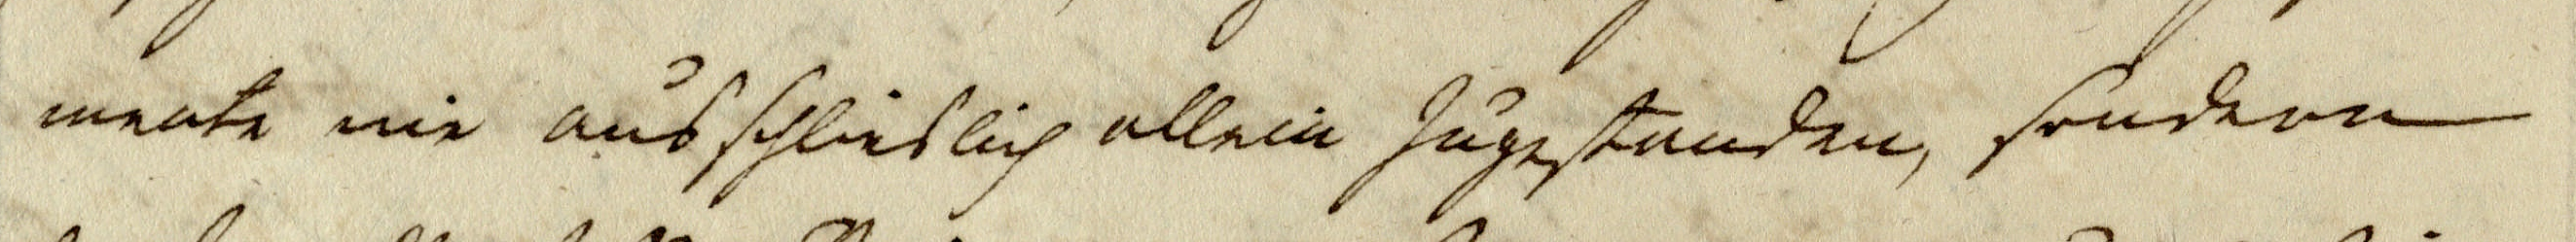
mente nie ausschlieslich allein zugestanden, sondern
